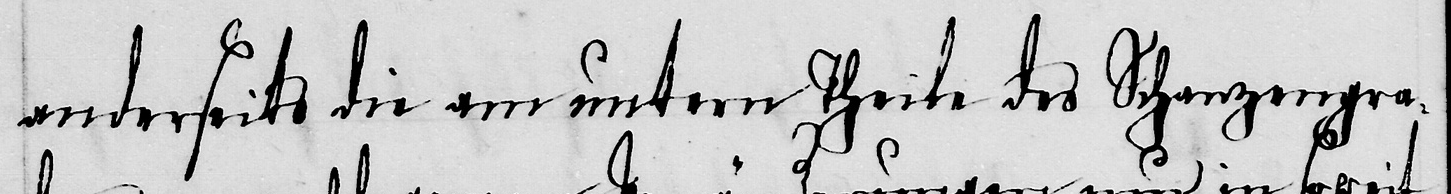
anderseits die am untern Theile des Schanzengra¬
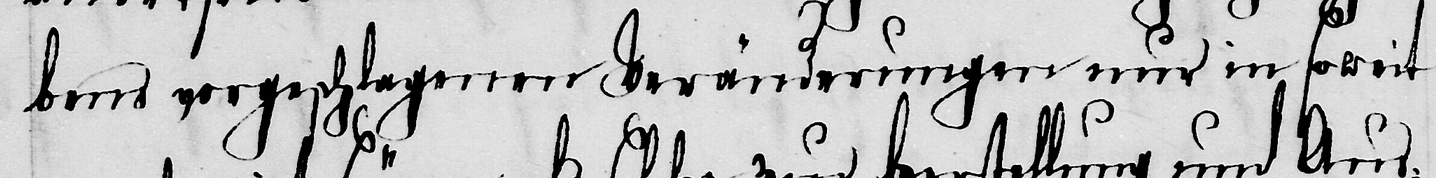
bens vorgeschlagenen Veränderungen nur in soweit
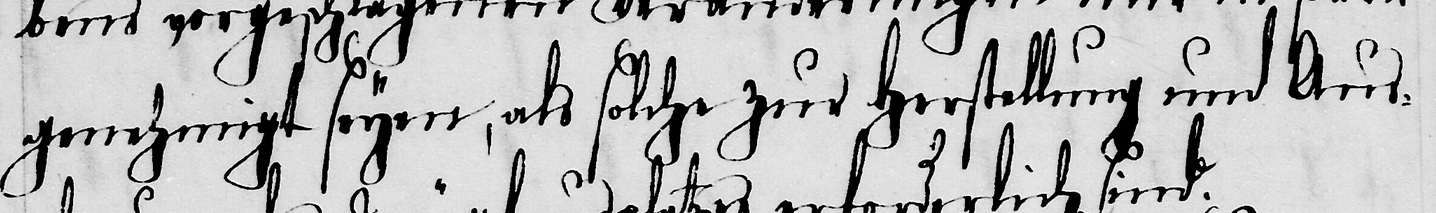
genehmigt seyen, als solche zur Herstellung und Aus¬
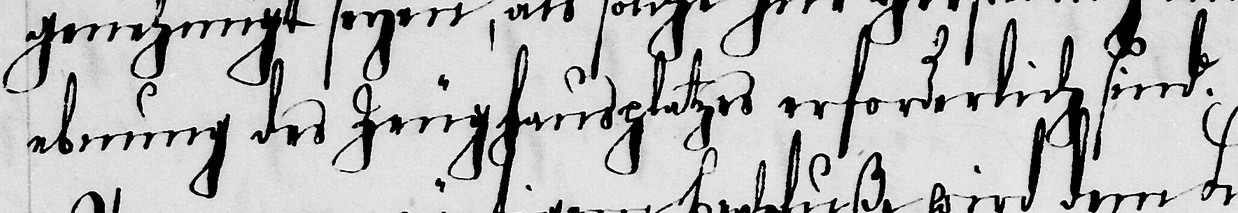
ebnung des Zeughausplatzes erforderlich sind.
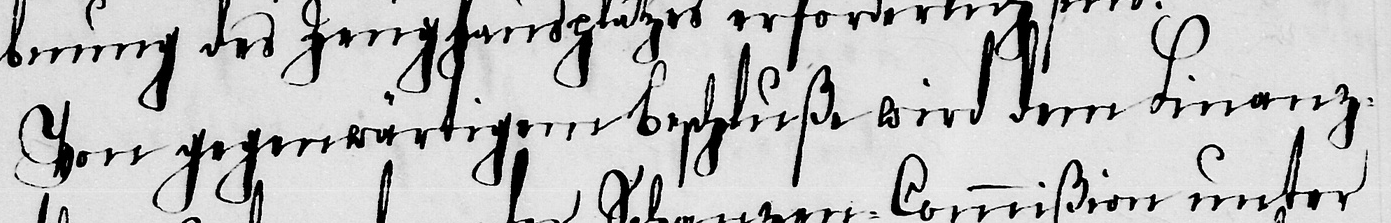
Von gegenwärtigem Beschluße wird dem Finanz¬
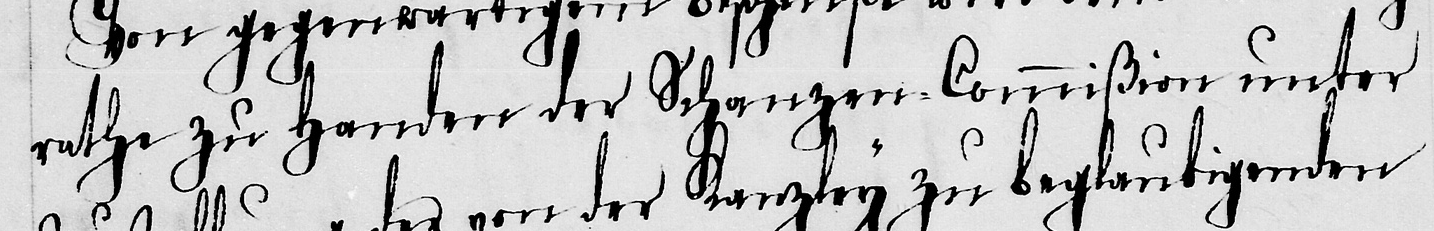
rathe zu Handen der Schanzen-Commißion unter
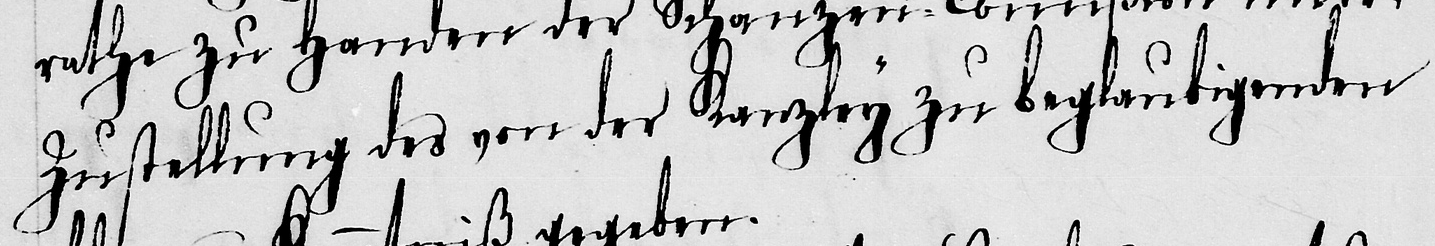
Zustellung des von der Kanzley zu beglaubigenden
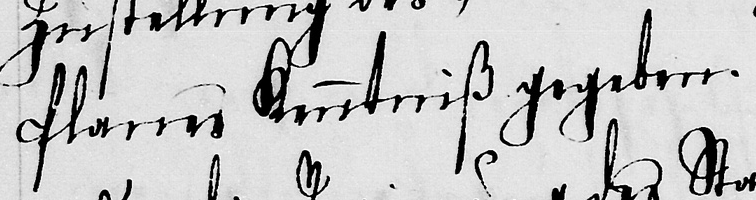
Planes Kenntniß gegeben.
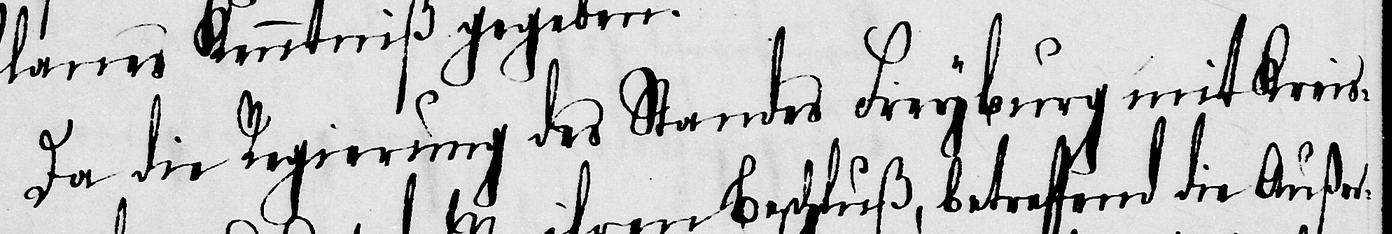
Da die Regierung des Standes Freyburg mit Kreis¬
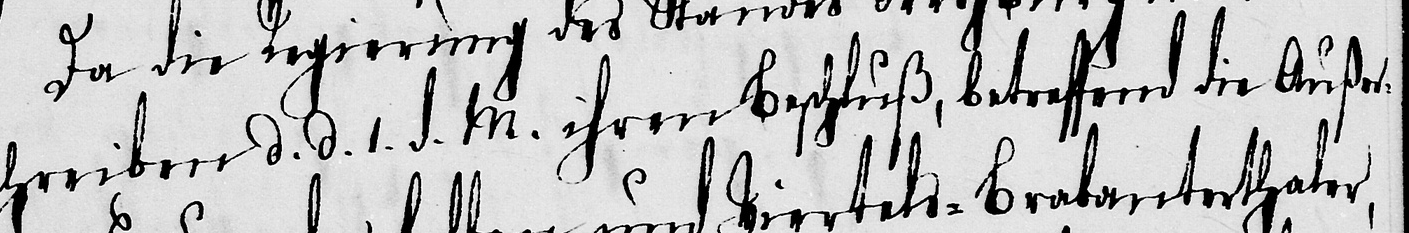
hreiben d. d. 1. d. M. ihren Beschluß, betreffend die Auß¬
